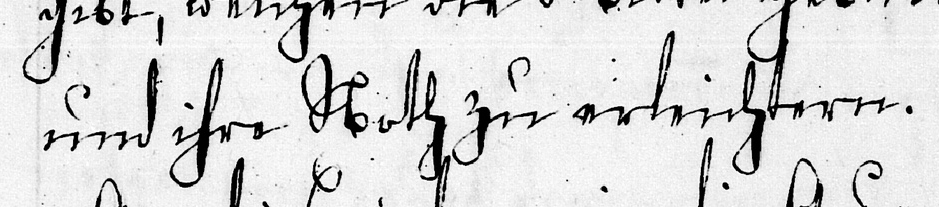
und ihre Noth zu erleichtern.
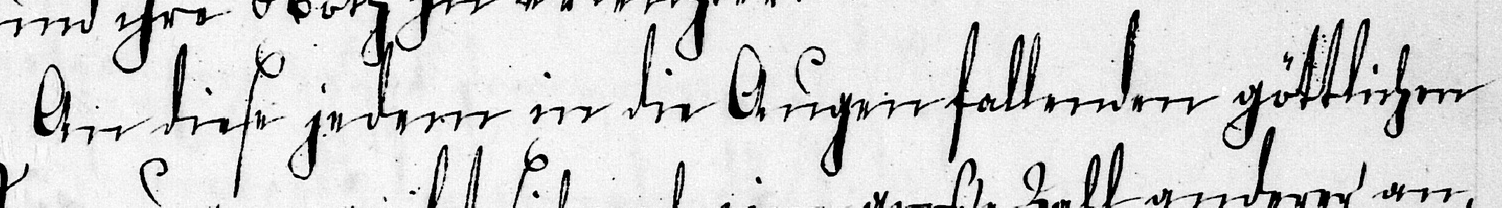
An diese jedem in die Augen fallenden göttlichen
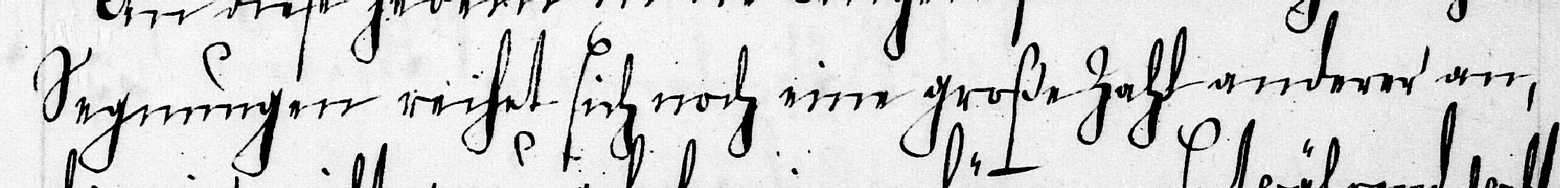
Segnungen reihet sich noch eine große Zahl anderer an,
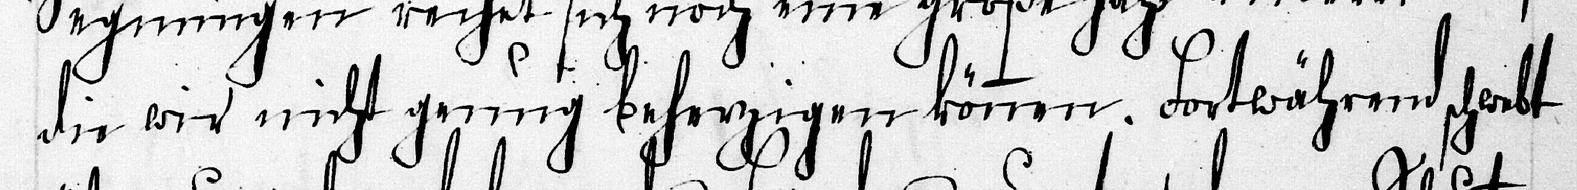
die wir nicht genug beherzigen können. Fortwährend schwebt
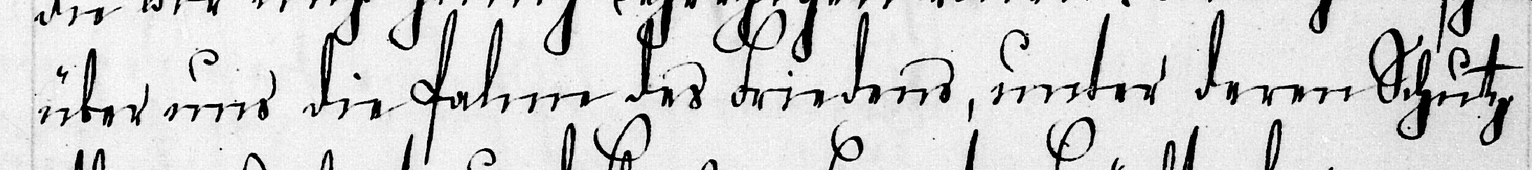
über uns die Palme des Friedens, unter deren Schutz
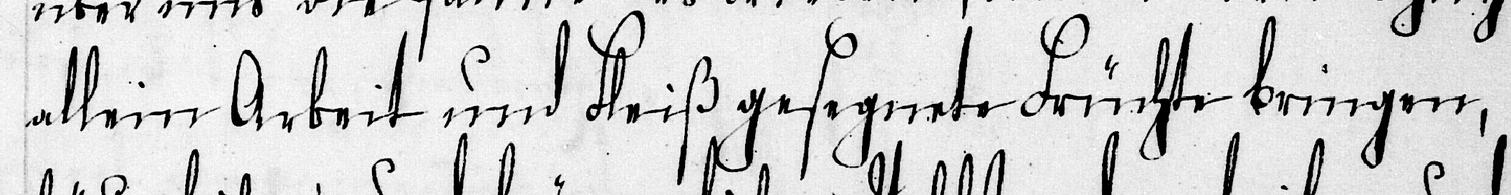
allein Arbeit und Fleiß gesegnete Früchte bringen,
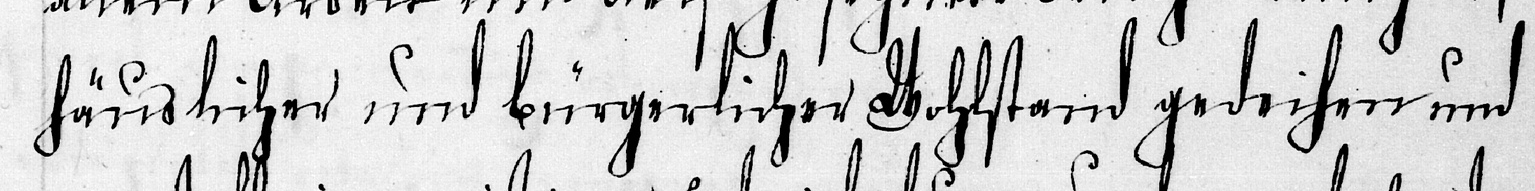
häuslicher und bürgerlicher Wohlstand gedeihen und
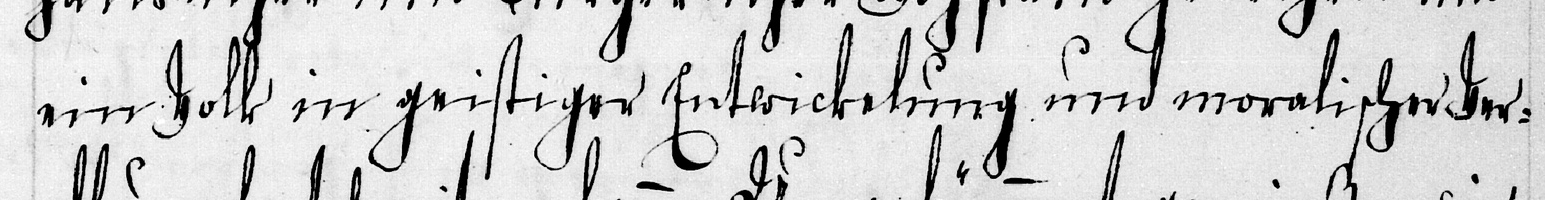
ein Volk in geistiger Entwickelung und moralischer Ve¬
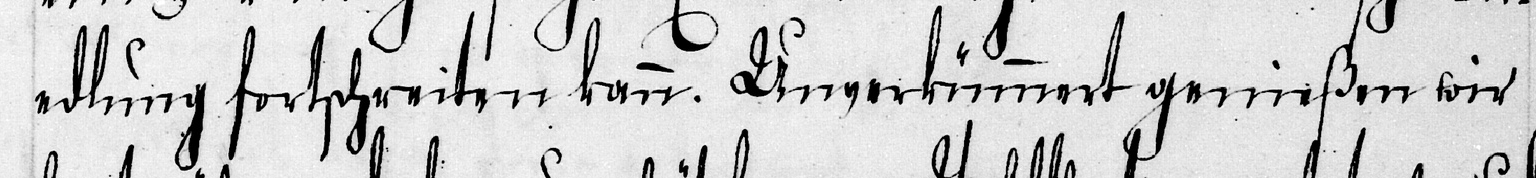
redlung fortschreiten kann. Unverkümmert genießen wir
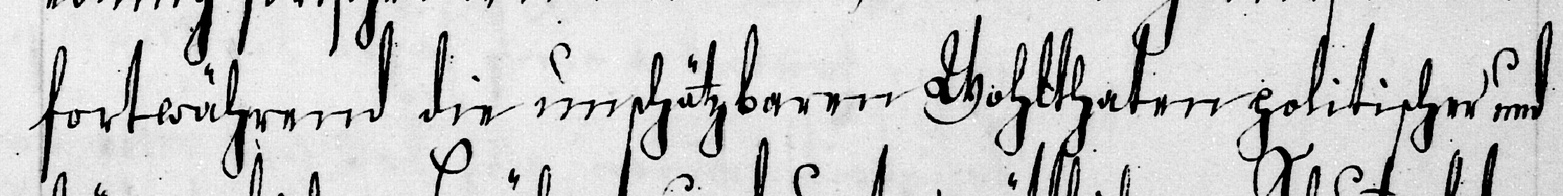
fortwährend die unschätzbaren Wohlthaten politischer
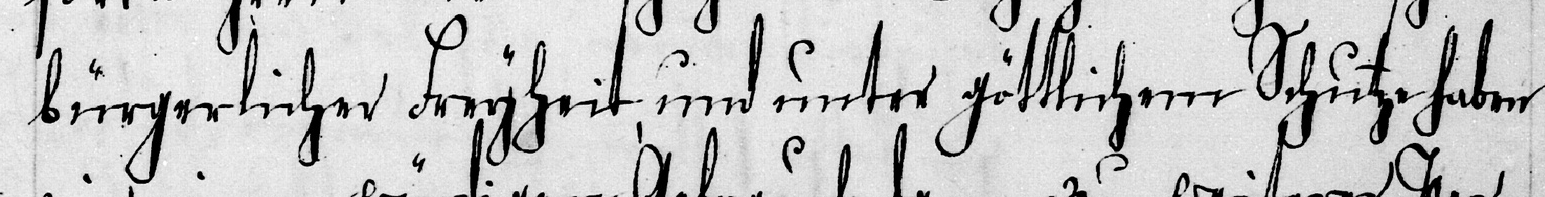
bürgerlicher Freyheit und unter göttlichem Schutze haben
